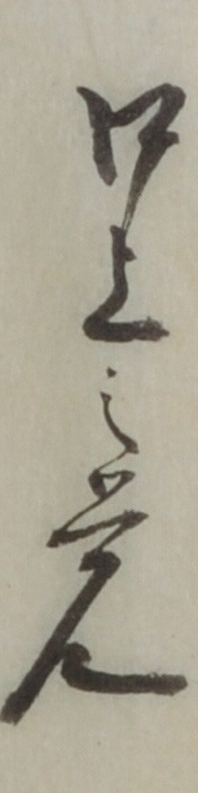口上之覚
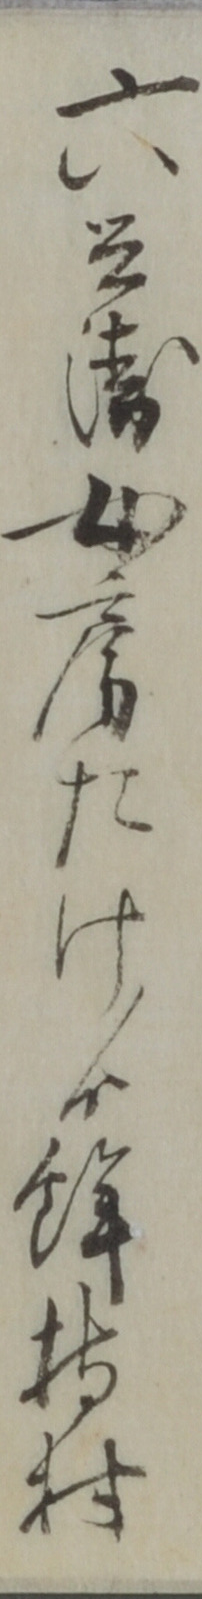六兵衛女房たけより鉾持村
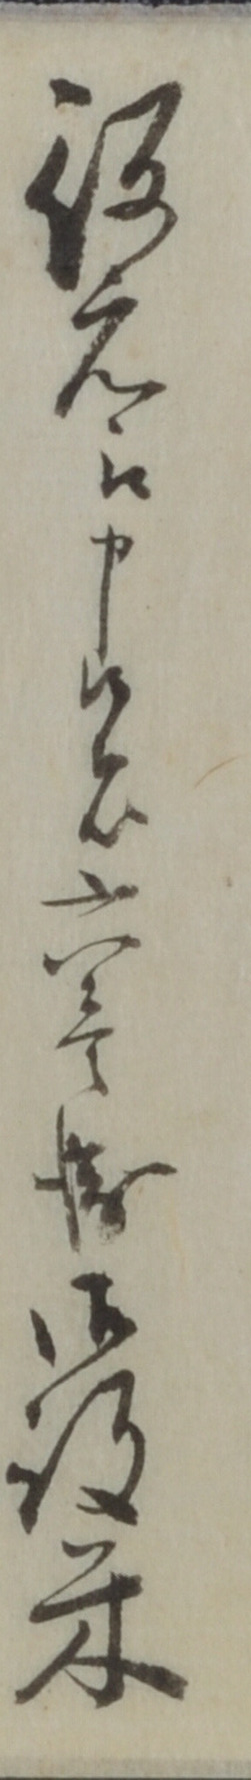役元え申候は六兵衛御役米
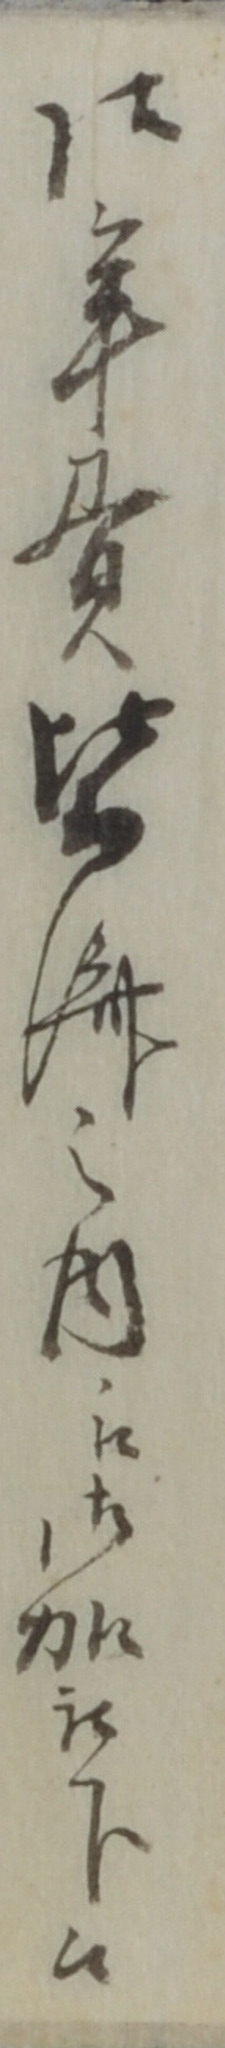御年貢皆済の内え御加被下候
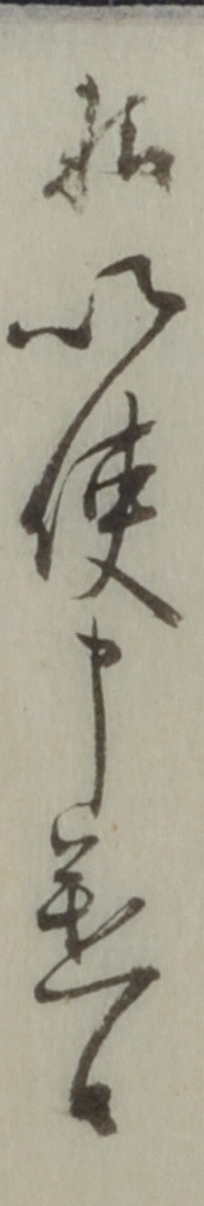様以使申遣候
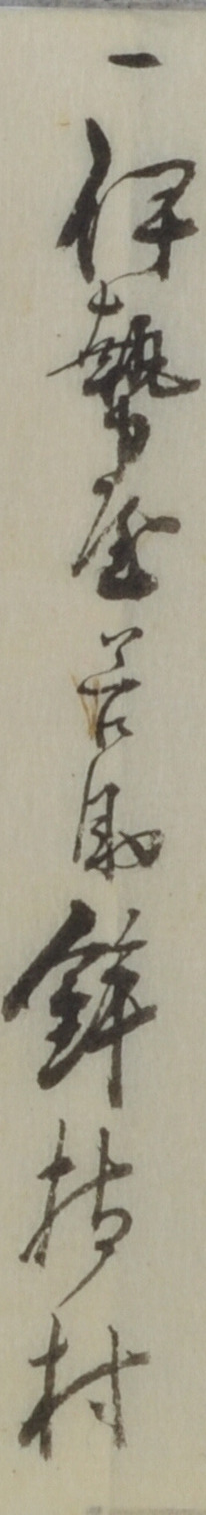一伊勢屋善助鉾持村
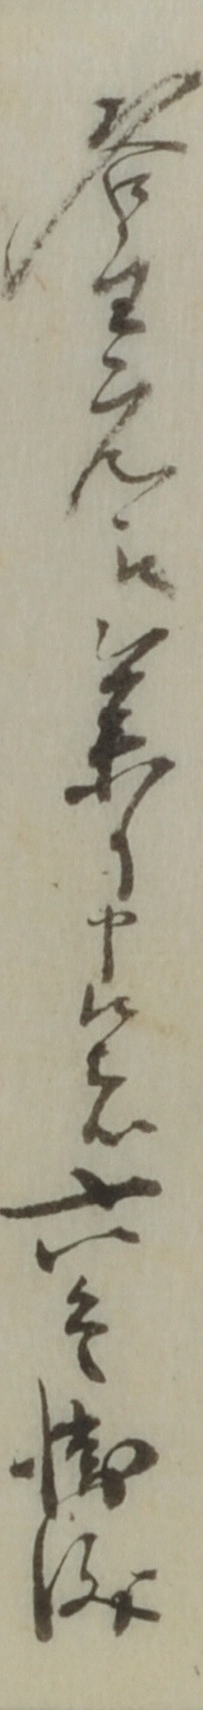名主元え参り申候は六兵衛儀
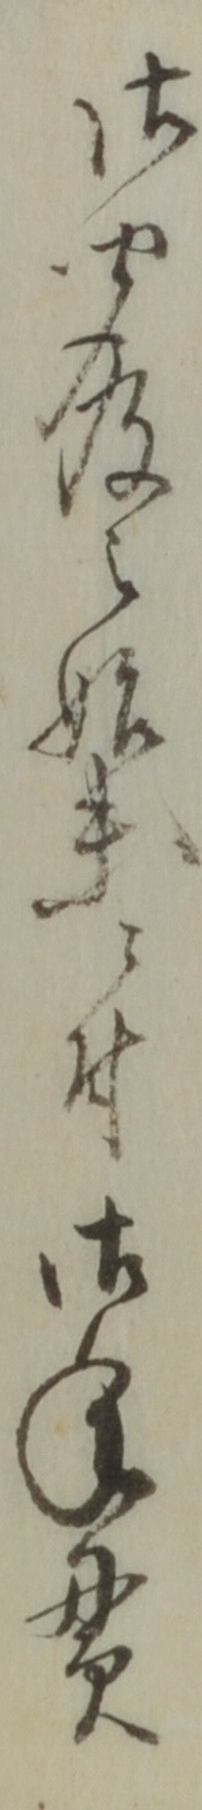御聞及之始末に付御年貢
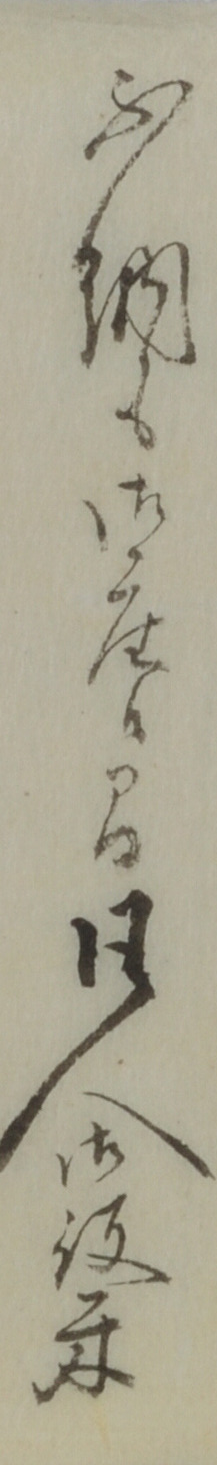不納も御座候間同人御役米
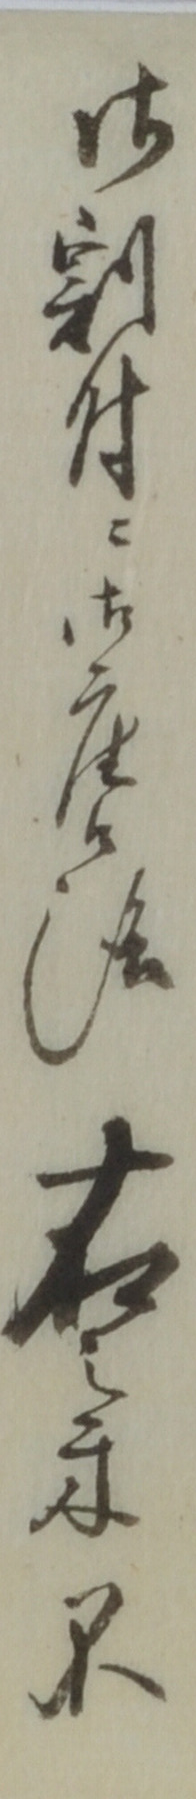御割付に御座候趣右之米不
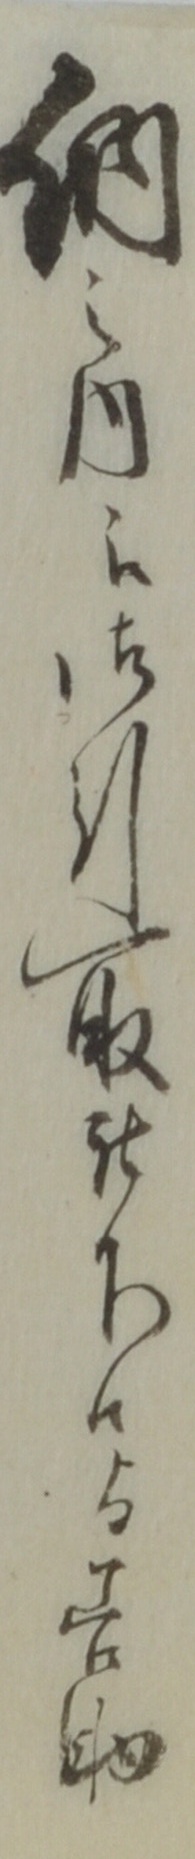納之内え御引取被下候と善助
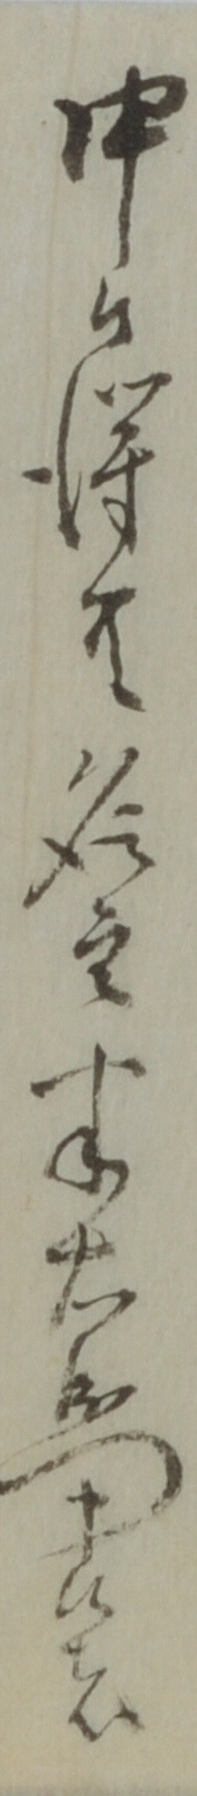申候得共名主半右衛門申候者
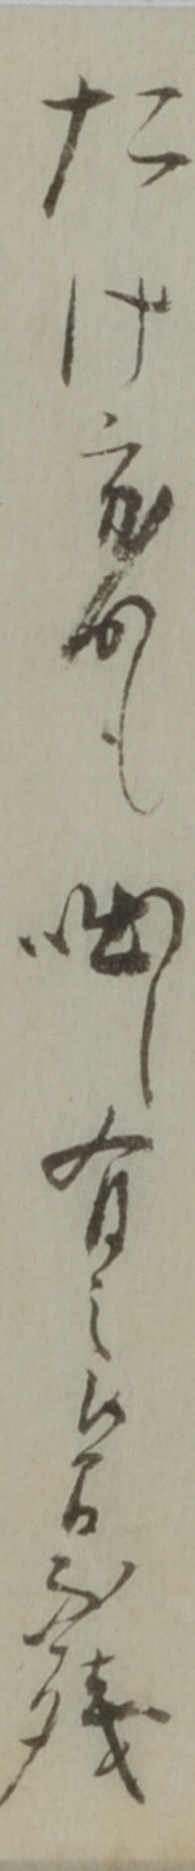たけ方よりも咄し有之候間不残
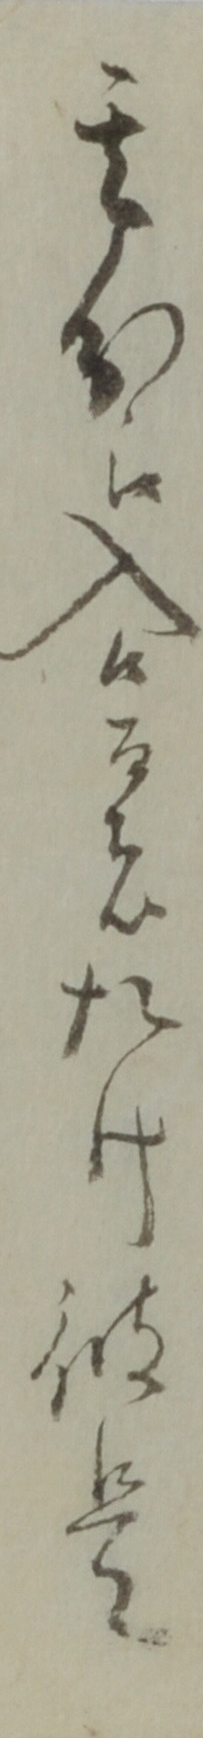其分え入候てはたけ彼是
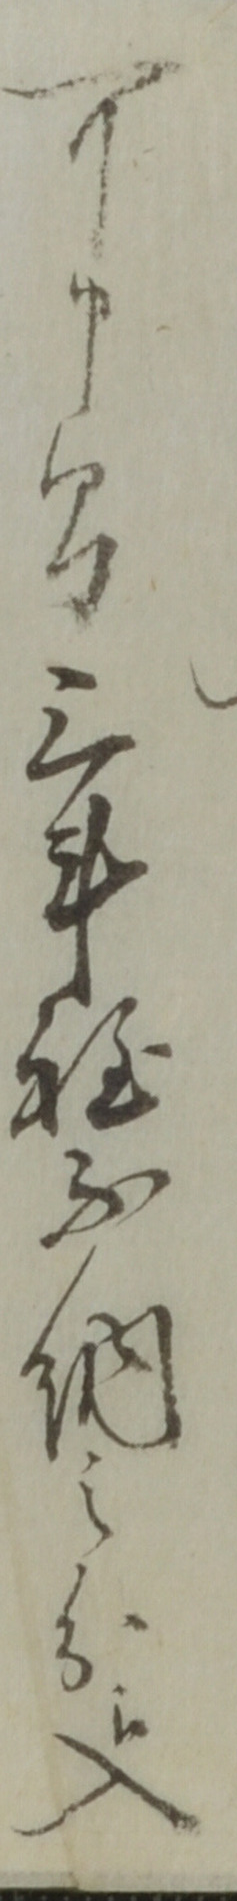可申間三年程不納之分え入
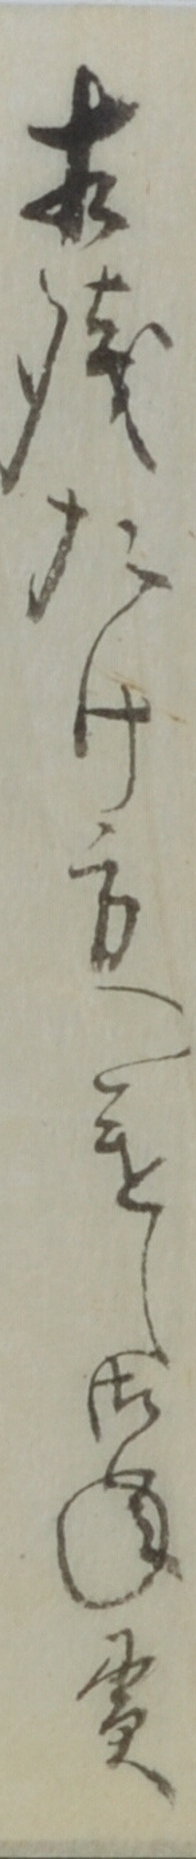相残たけ方へ遣し御年貢
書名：口上之覚
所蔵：伊那市立高遠町図書館・合同会社AMANE
